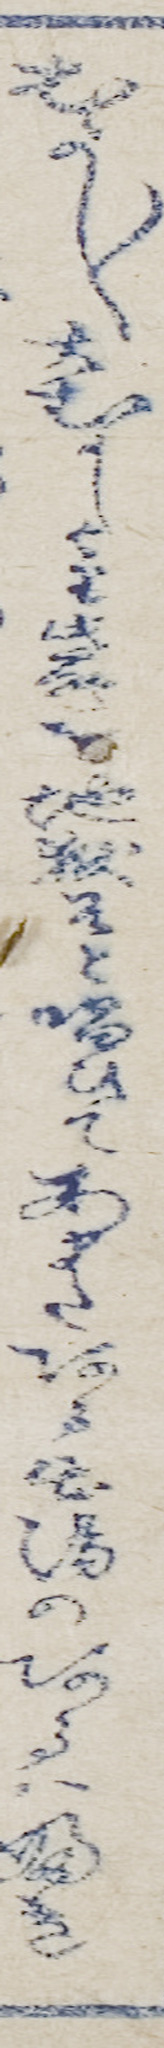むかし〳〵大むかしより此處を地獄谷と唱ひてあまたある出湯のあるはふき
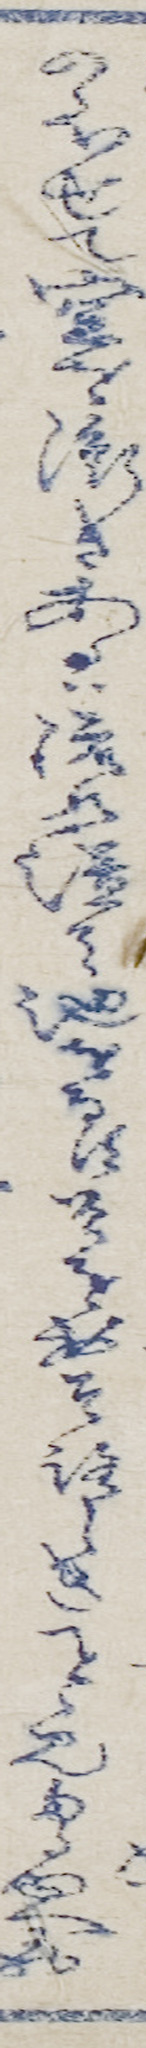のほせて空を衝きあるは流れ深く池をなすそはおそろしき見たるゆへ
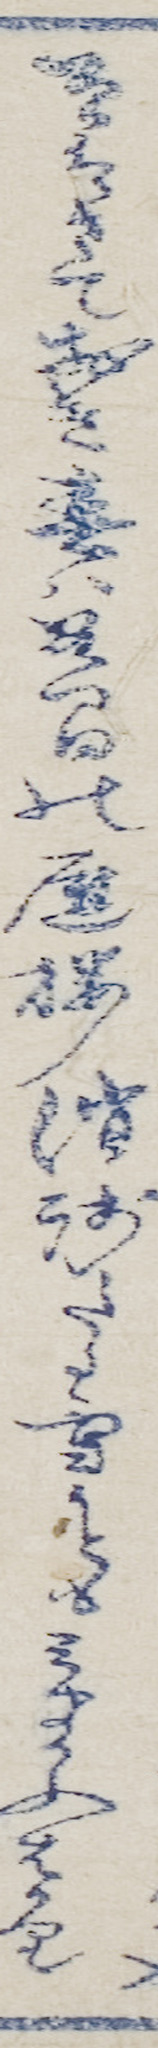さておき喜は間の歴桜の消沙たる雪かともみまかふはかり
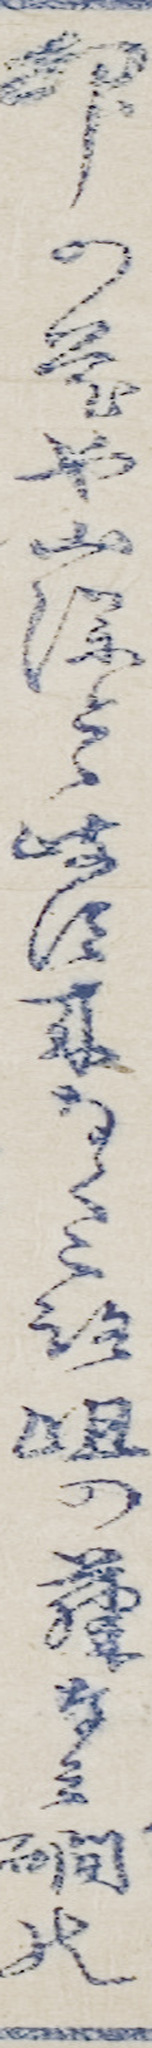卯の花や山ほとゝぎす来なくこのなみ礀の
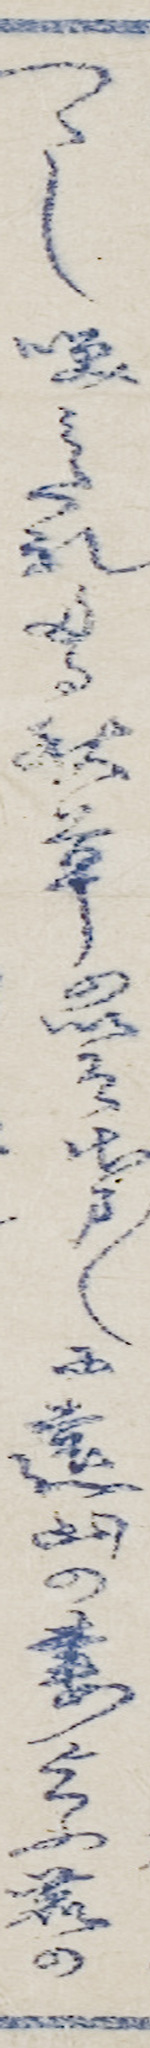つゝしの咲みたれたる秋草のいろさま〳〵に遠山のよふ花の
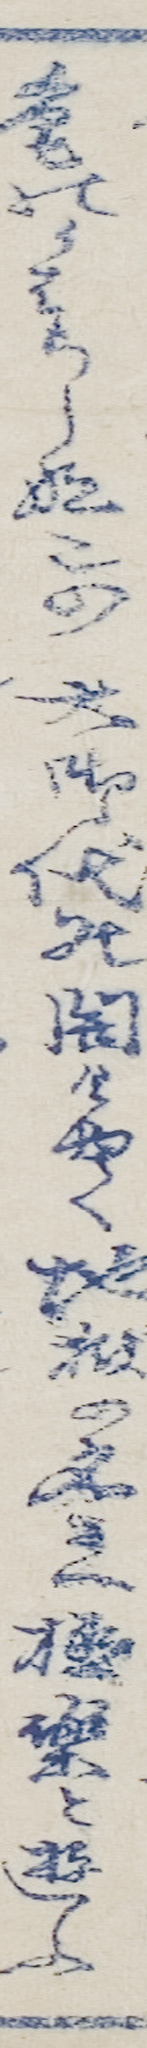はらしこの大御世の開けゆく地獄の名さへ極楽と遊ふ
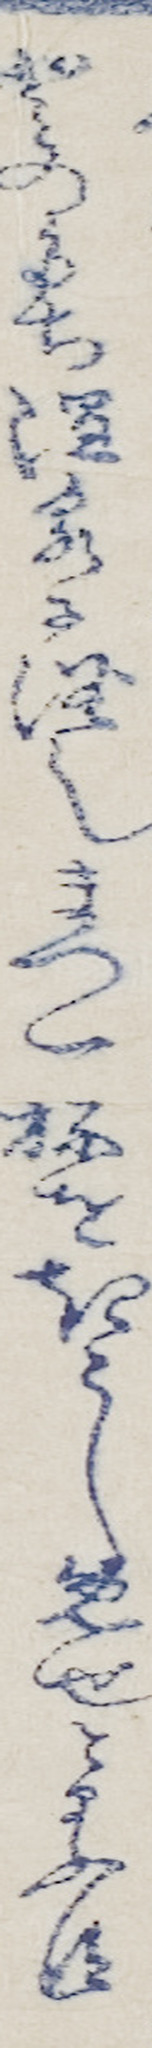そのたち温泉に浴しまつ一杯をきこしめせとまふす
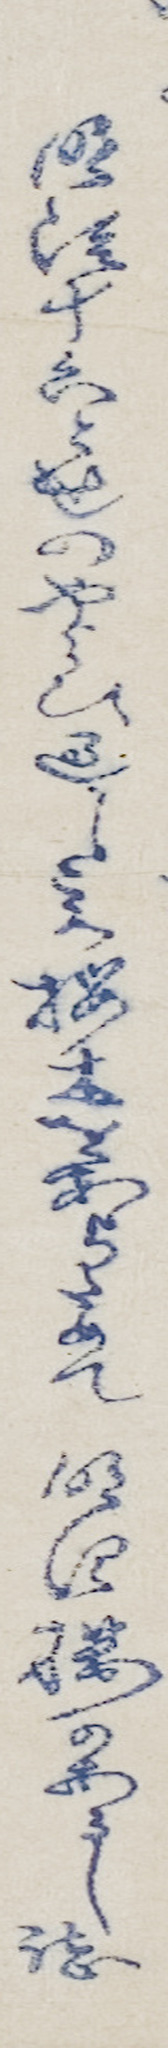明治十六とせのやよひ通りたみ桜木をあらためて明夜樓のあるし誌
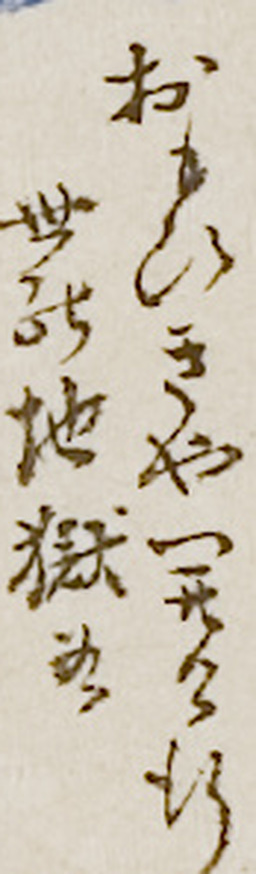世の地獄谷
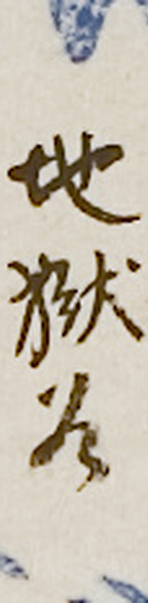地獄谷
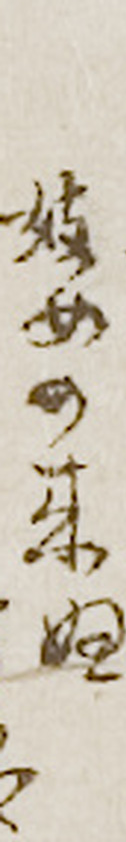妓女の来ぬ
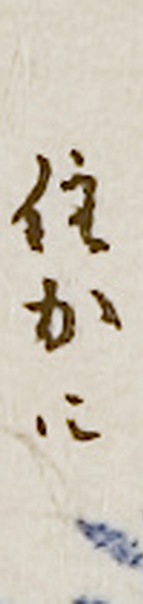住かに
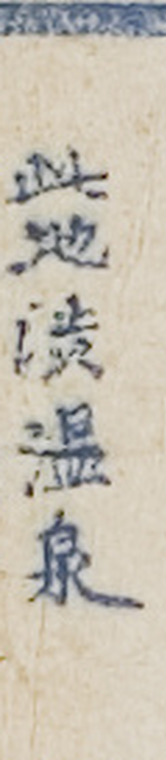此地渋温泉
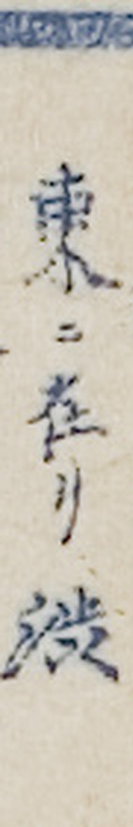東ニ在リ渋
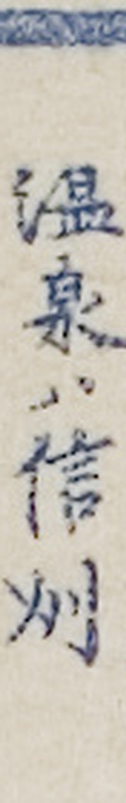温泉ハ信州
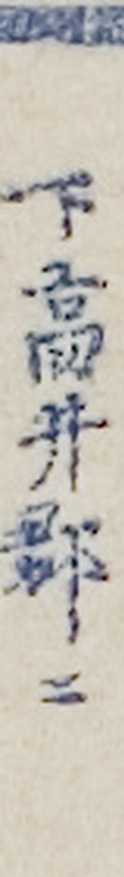下高井郡ニ
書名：地獄谷温泉明夜樓眺望之図
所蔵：東京大学総合図書館 General Library in the University of Tokyo, JAPAN
